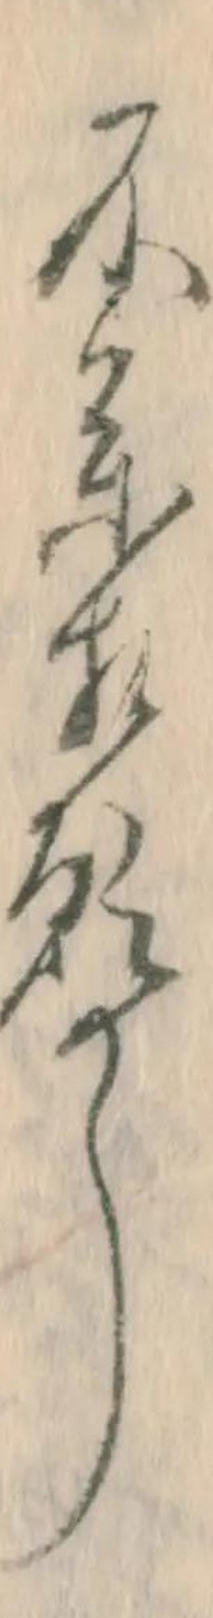不参相願了
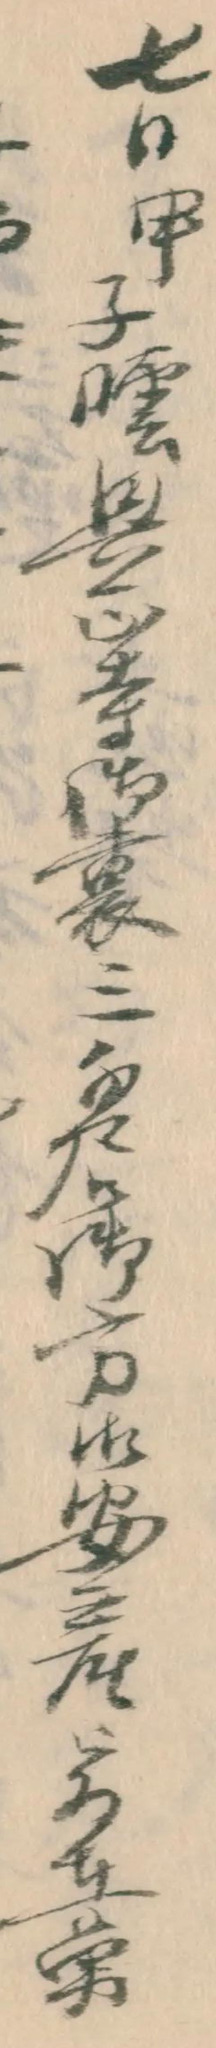七日甲子曇興正寺御裏三手居御方御安産被為在候男
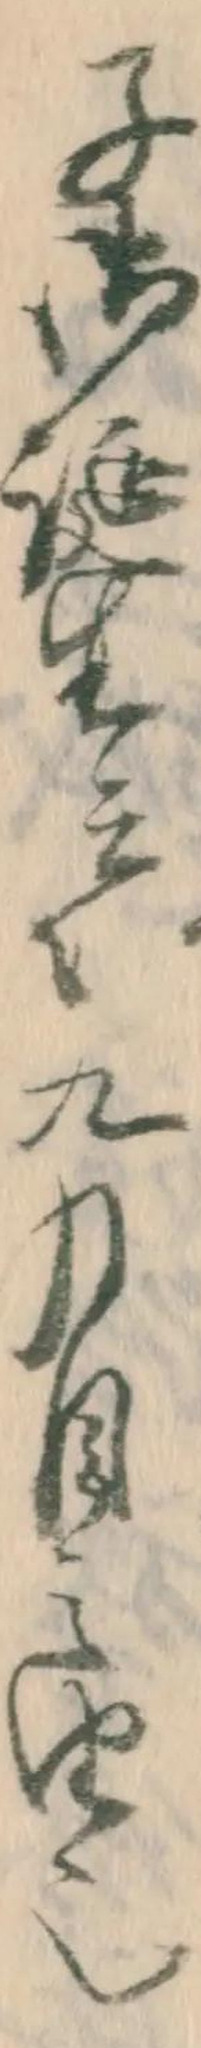子御誕生云々九月目之由也
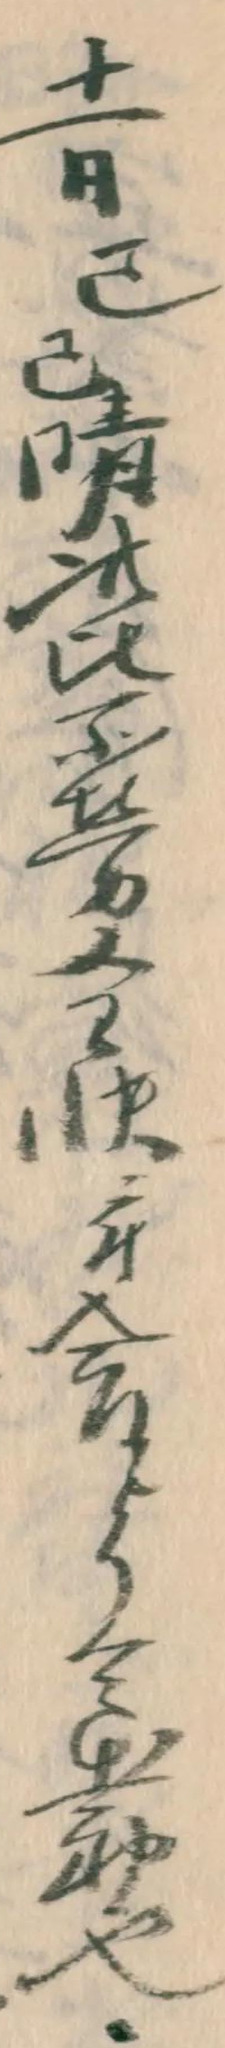十一日己巳晴此頃所労全快ニ付今日より令出勤也
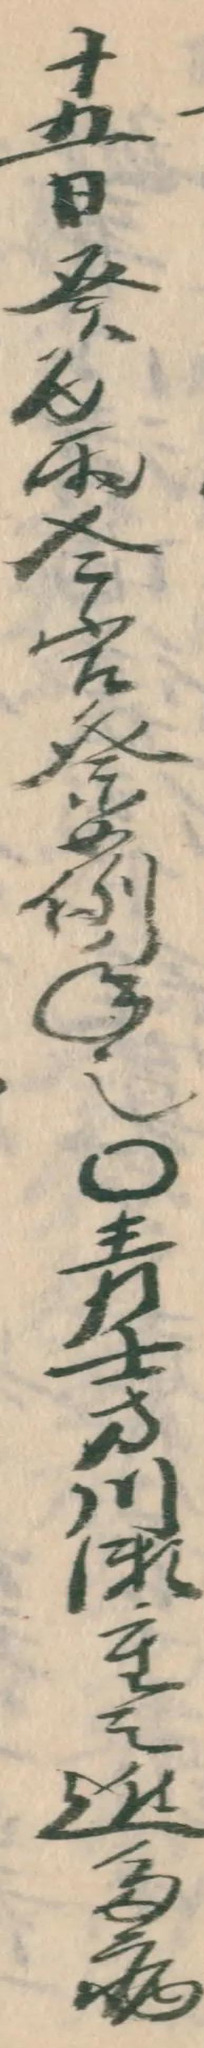十五日癸巳雨今宮祭例年也〇青士方川瀬重之近多病
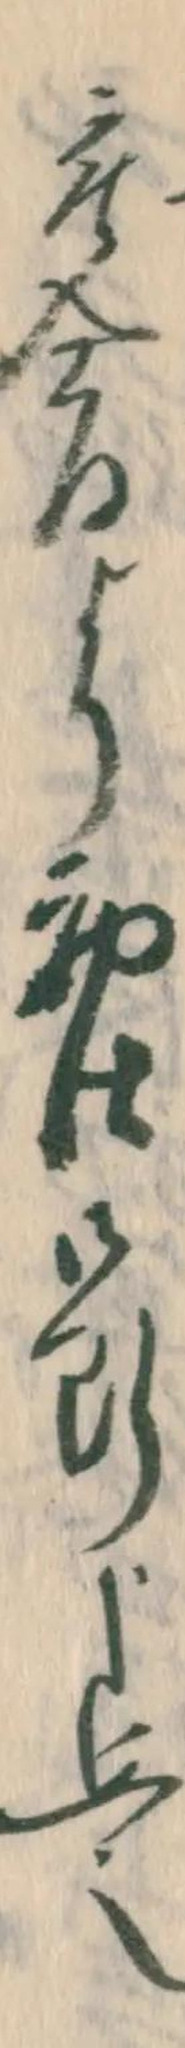ニ付今日より初仕御断申上也
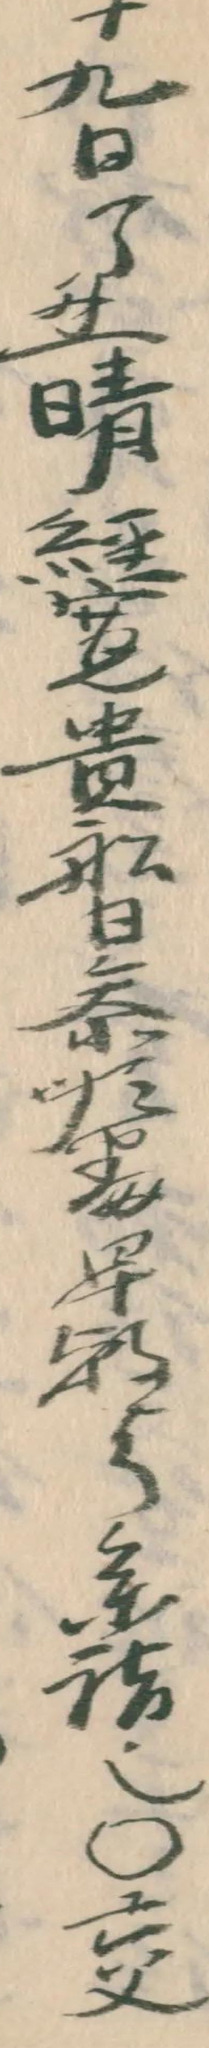十九日丁未晴経寛貴舩日参順番早朝より参詣也○亡父
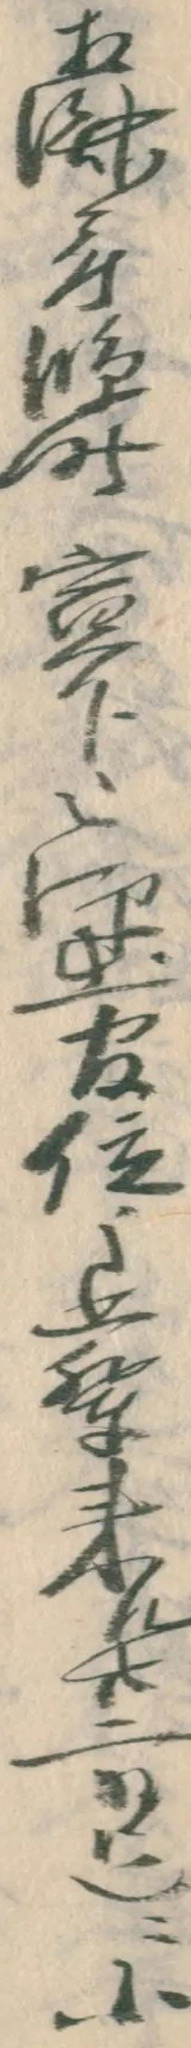相済ニ付臨時宣下之仰出官位之上輩来ル廿二日迄ニ小
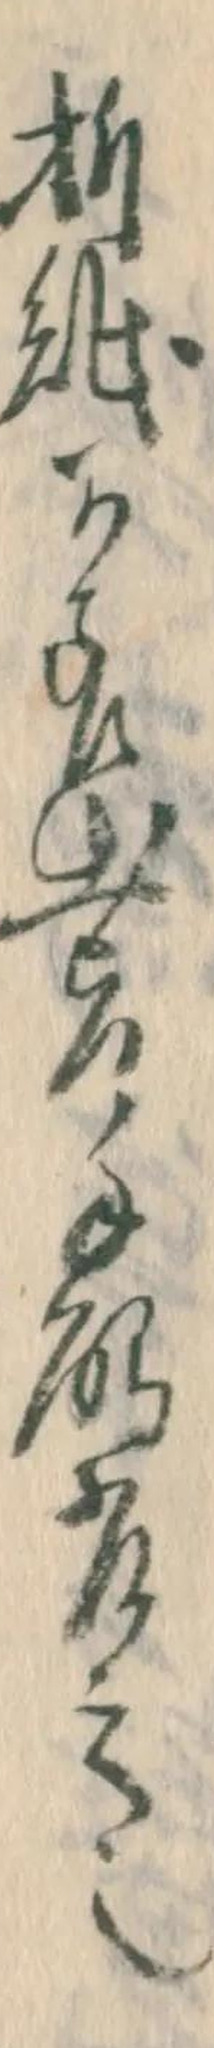折紙可差出旨手觸有之也
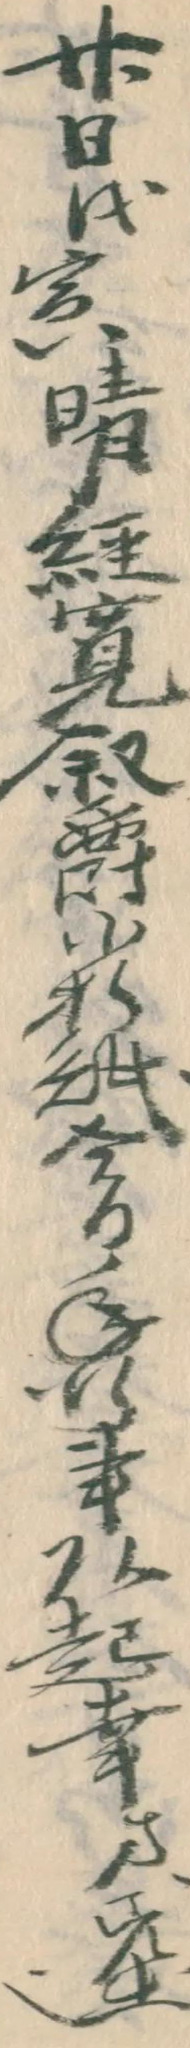廿日戊寅晴経寛叙爵小折紙今日年行事頭起幸方ヘ差出也
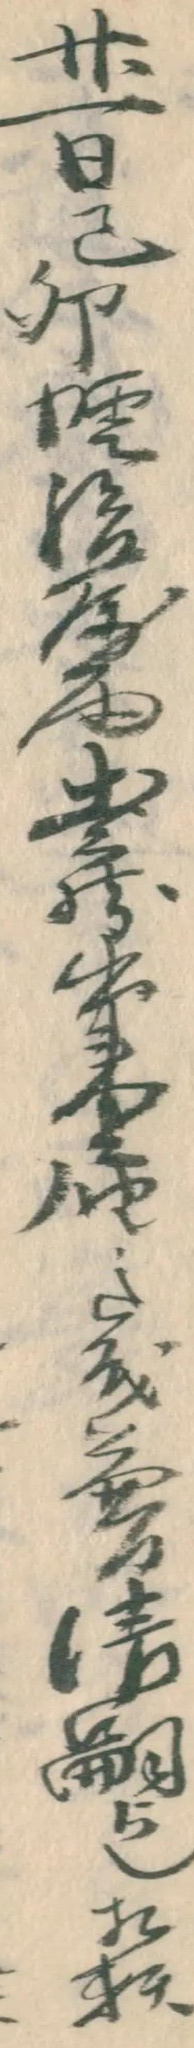廿一日己卯曇後属雨土蔵出来届之義兼而清嗣迄相頼
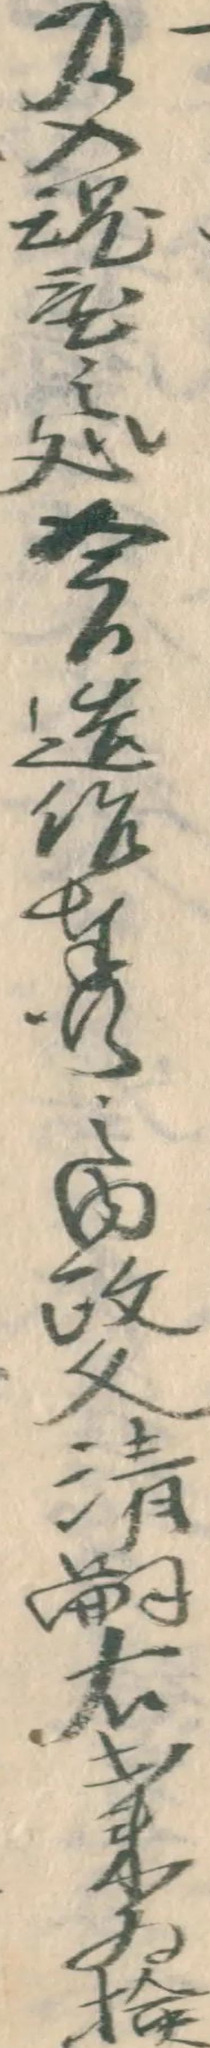及入魂置之処今日造作奉行之内政久清嗣右出来為検
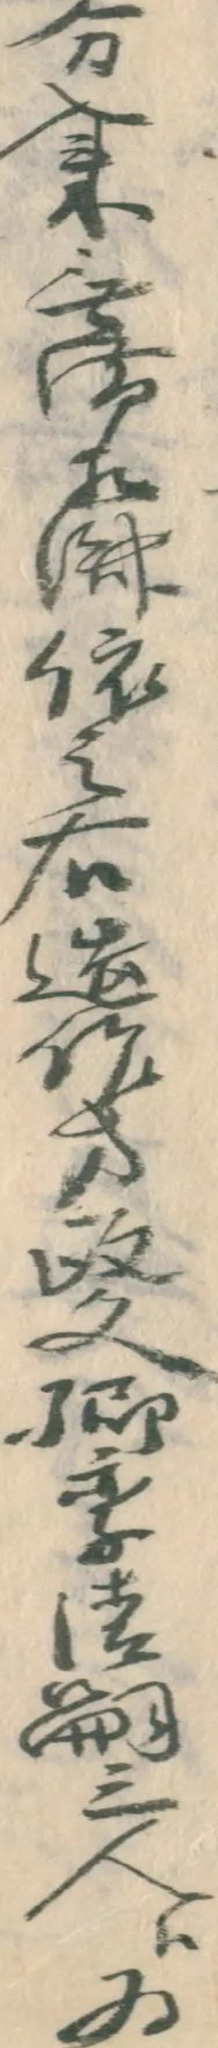分入来無滞相済依之右造作方政久卿季清嗣三人え為
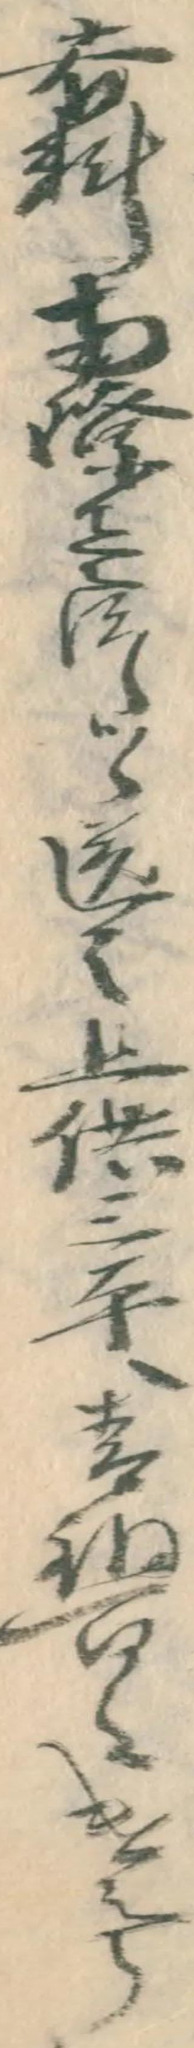肴料南鐐壱段ツヽ送之上供三平へ青銅百文遣之了

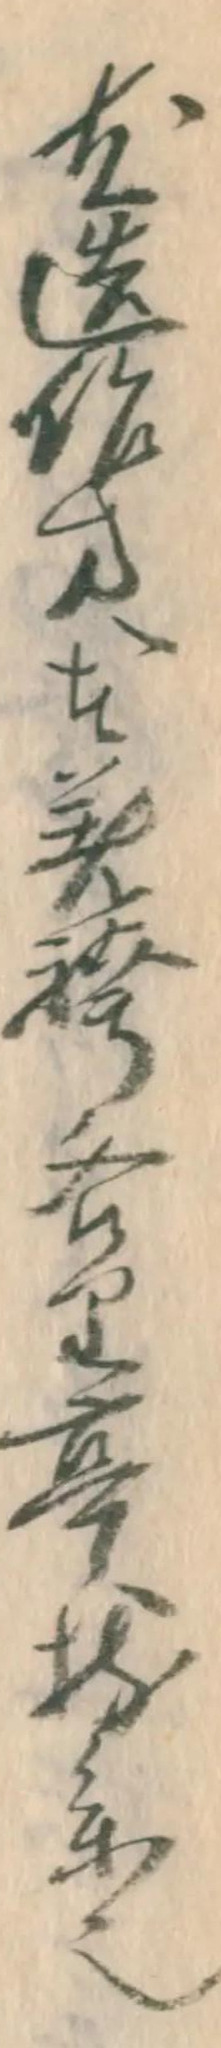尤造作方へは差袴各里亭へ持参也
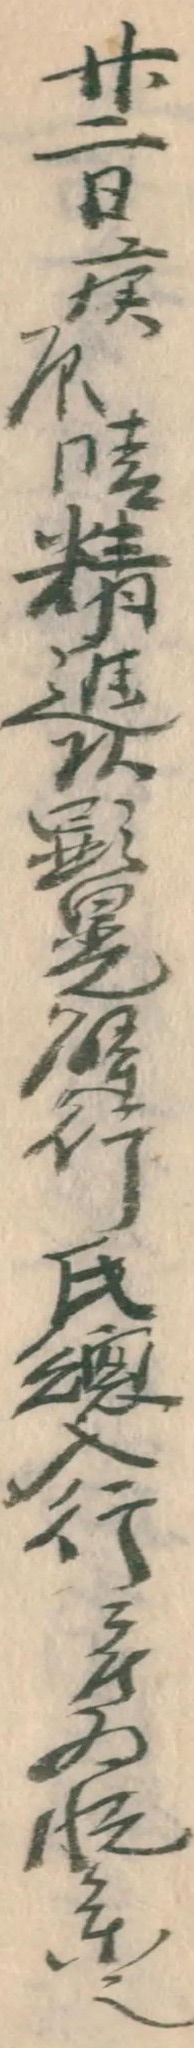廿二日庚戌晴精進頭顕晃觸行氏總入行ニ付為祝参也
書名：賀茂社記録. 第67冊
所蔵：国立国会図書館 National Diet Library, JAPAN
